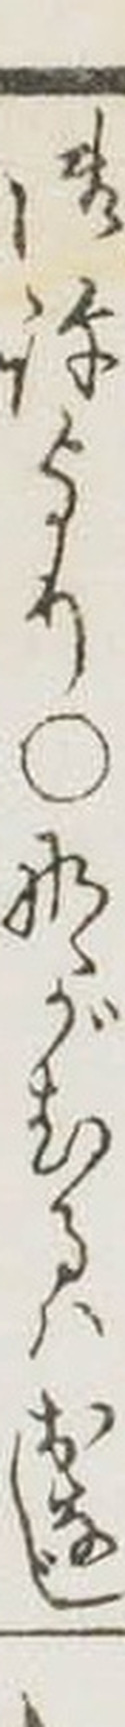御許より○ながむるはおなじ
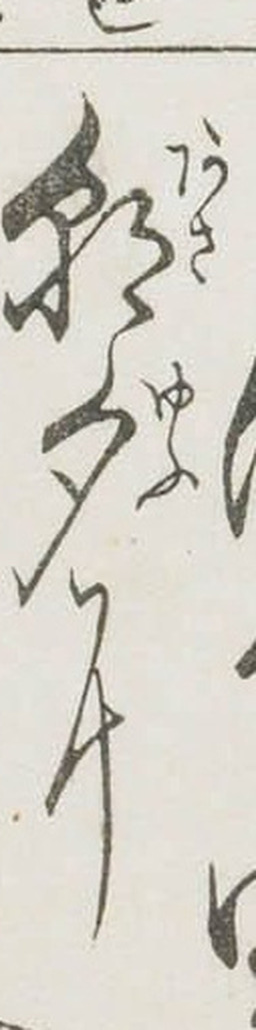朝夕に
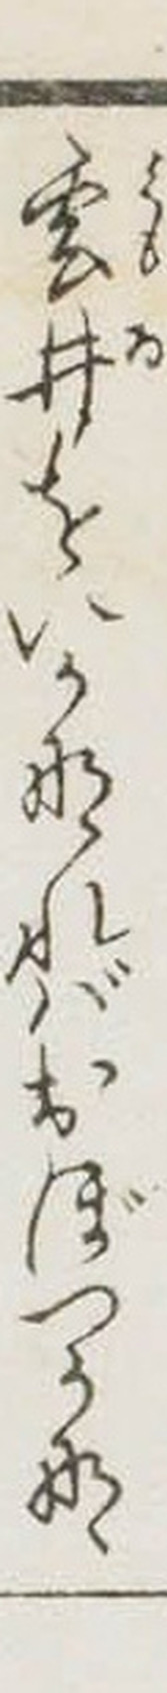雲井をいかなればおぼつかな
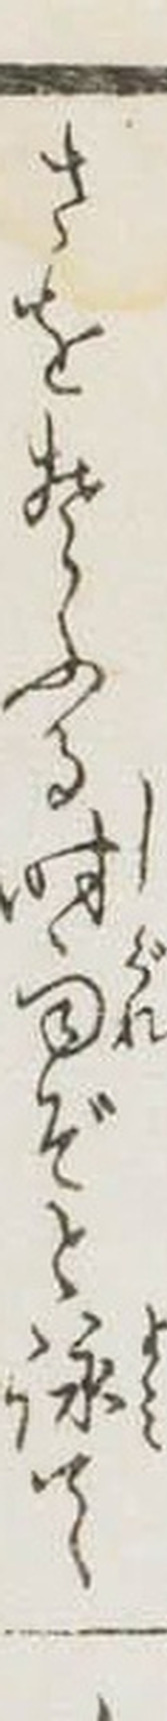さをそふる時雨ぞと詠て
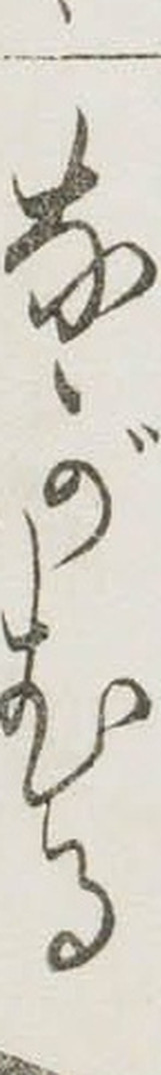ながむる
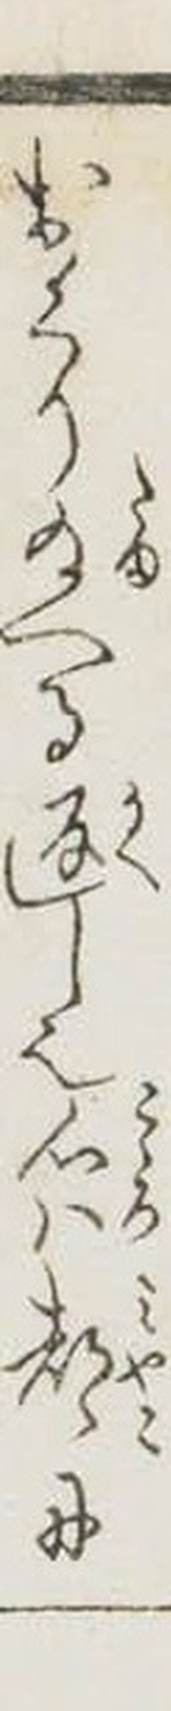おくり給へる返し也心は都に
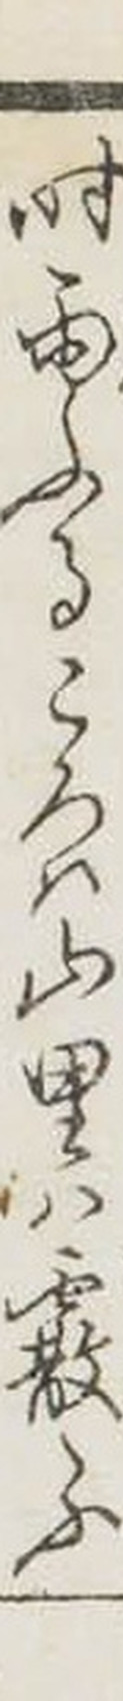時雨ふるころは山里は霰ふ
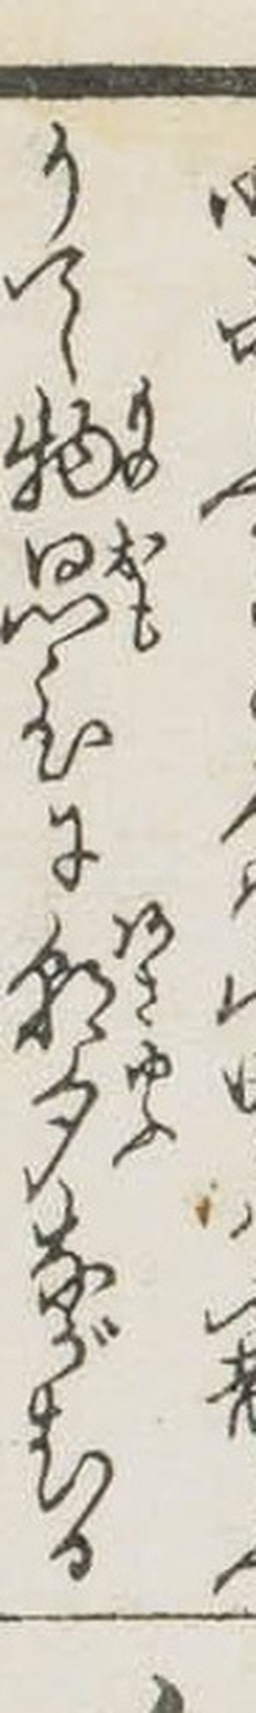りて物思ひに朝夕ながむる
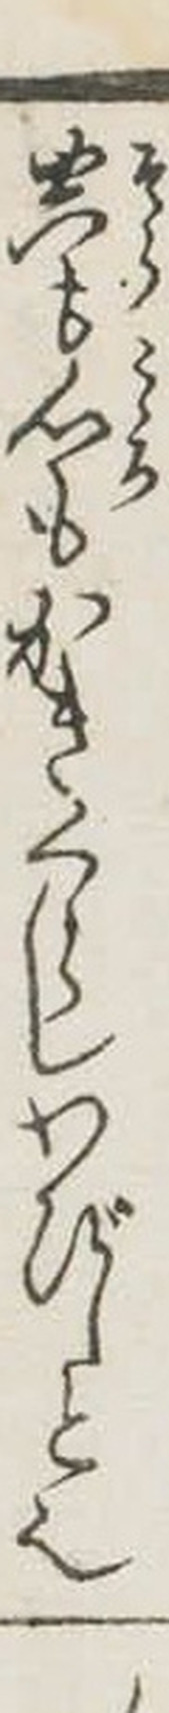空も心もかきくらしわびしと也

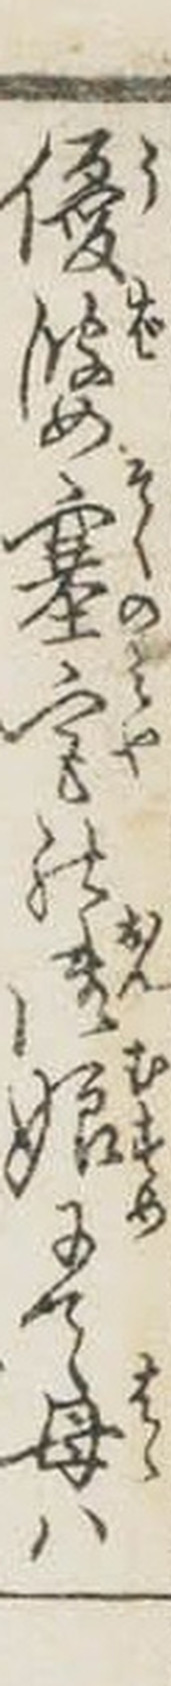優婆塞宮の御娘にて母は
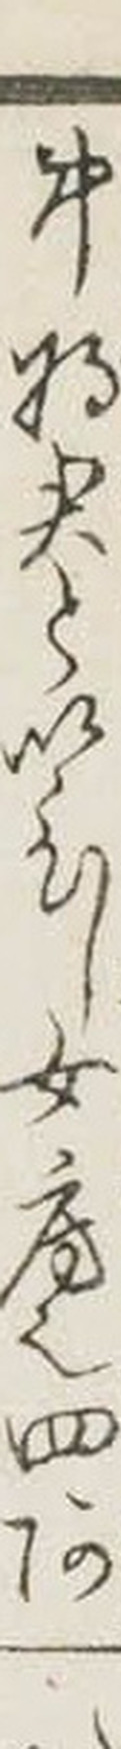中将君といひし女房也四阿
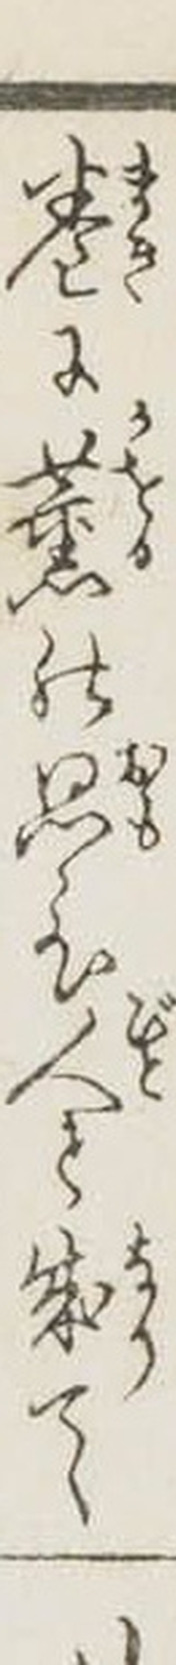巻に薫の思ひ人と成て
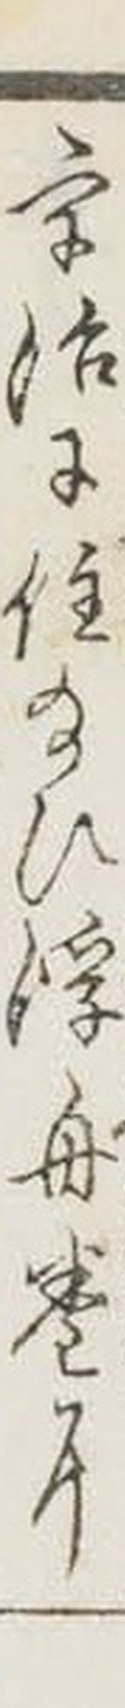宇治に住給ひ浮舟巻に
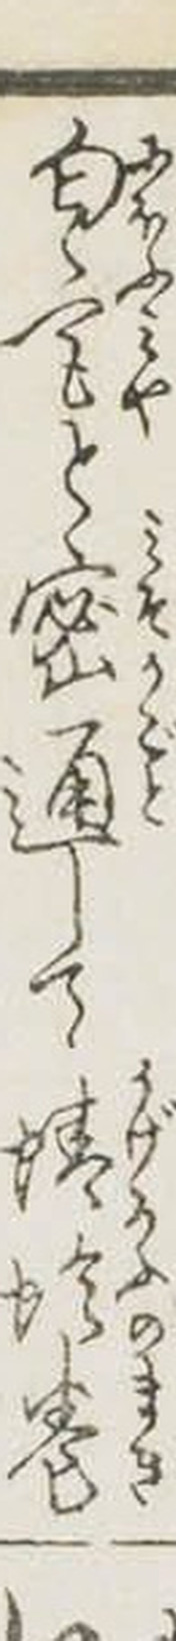匂宮と密通して蜻蛉巻
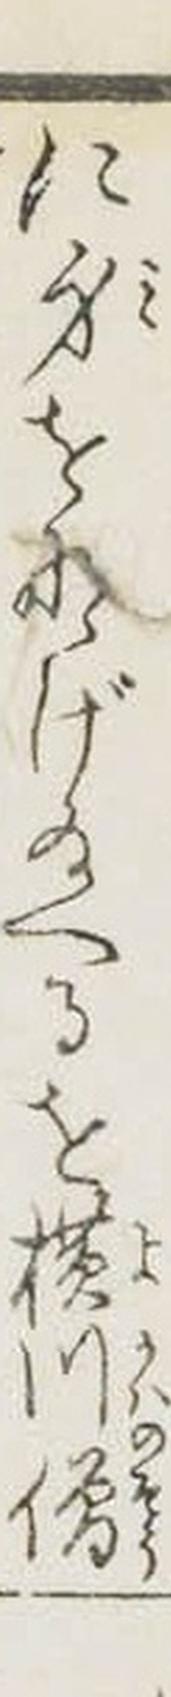に身をなげ給へるを横川僧
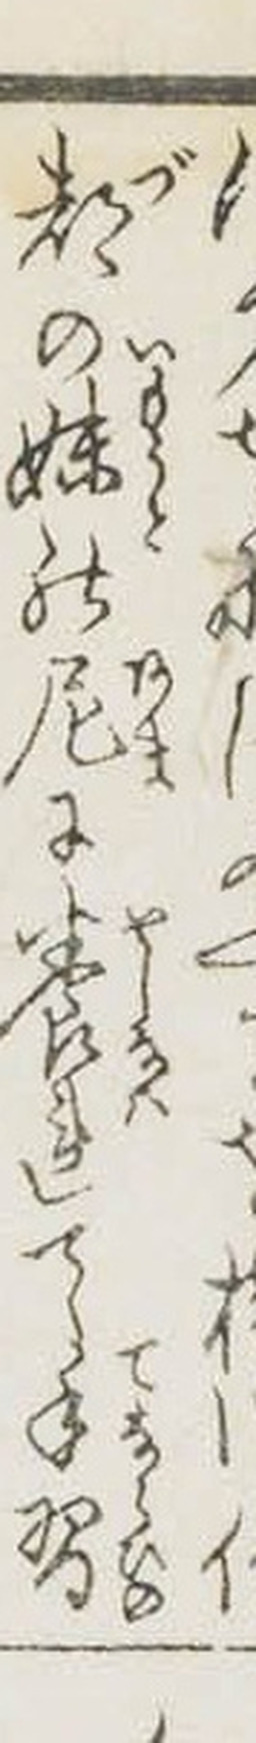都の妹の尼に養れて手習
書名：源氏百人一首
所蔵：東京学芸大学教育コンテンツアーカイブ
